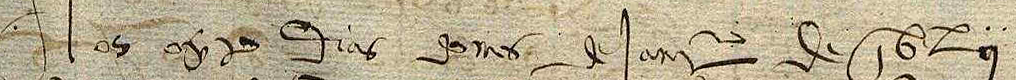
Aos oyto dias do mes de Janro de j̄ bc Lij
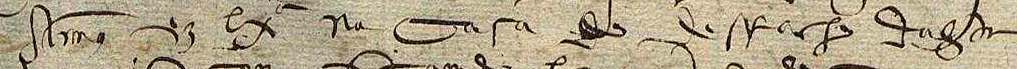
An̄nꝯ em lxa na Casa do despacho da Sta
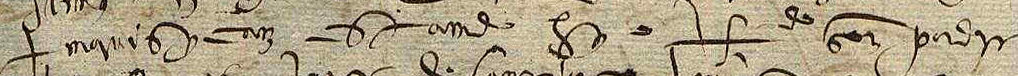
Jmquisyçam estamdo hy o Rdo sōr padre
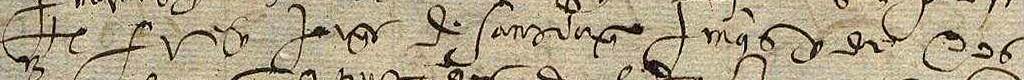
mte frey Jorge de santiago Jmq̄sydor e os
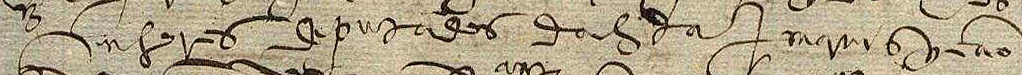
Senhores deputados da Sta Jmquisyção
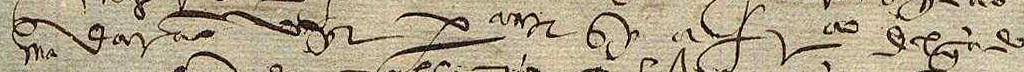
mādarão vyr ꝑante sy a frco delgado
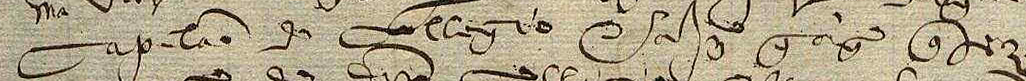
Capelão do Collegio e a Jmo gago q̄ tem
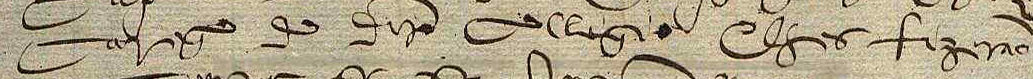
carego do dīto Collegio e lhes fizerão
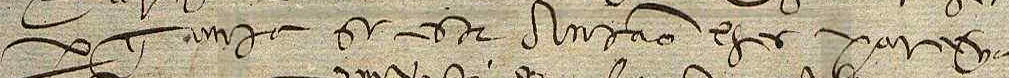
ꝑgumta se este Antaõ lhes parecya
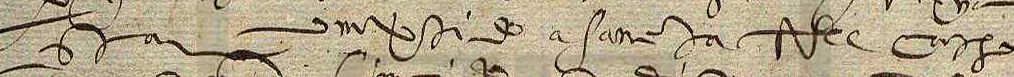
estar Comꝟetido a sancta ffee catho
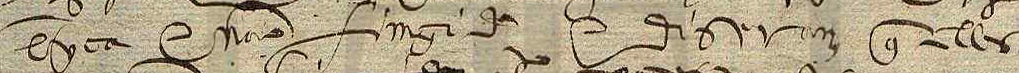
lyca e não fimgido e diseram q̄ elles
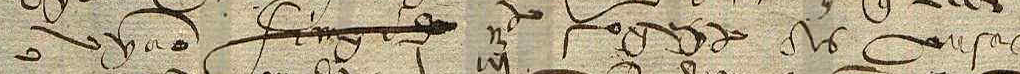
o vyão fimgido mto sogeyto As Cousas
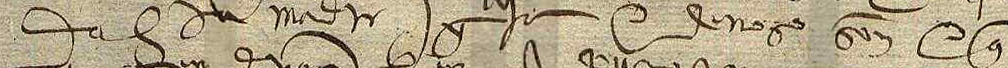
da Sta madre JḡJa e de noso s̄or e q̄
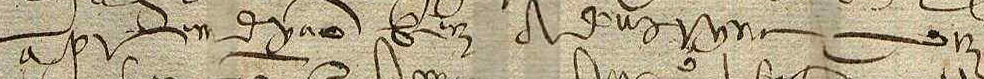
apremdyão bem A doutryna Com
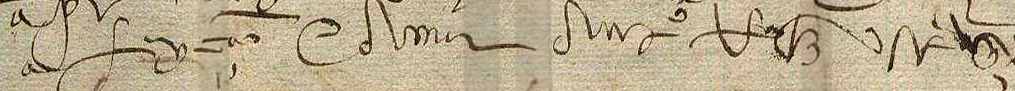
afeyção e Amor Anto Roj̄z o sp̄vy
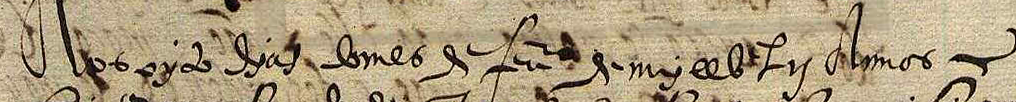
Aos oyto dyas do mes de feuro de myll bc Lij Annos ē
